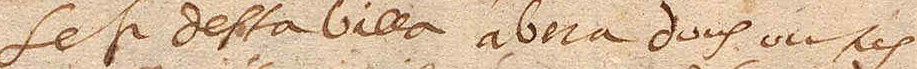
se Jr desta villa avera dous ou tres
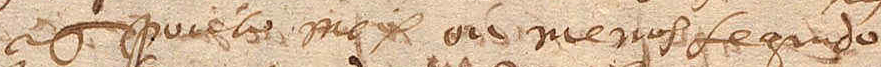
ans pouco mais ou menos segundo
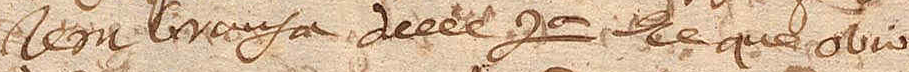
lembransa delle ta he que ovio
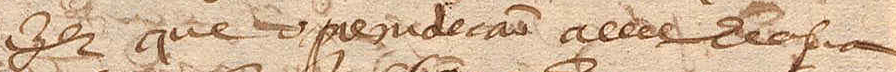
dizer que o premderaõ a elle he a sua
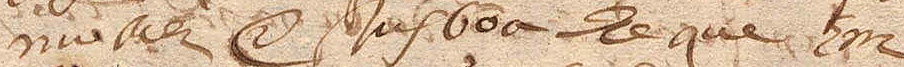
molher ē Lisboa he que Em
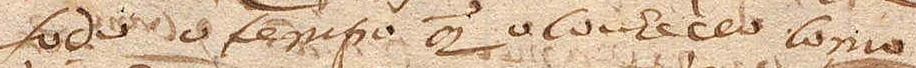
todo o tempo q̄ o conheçeo como
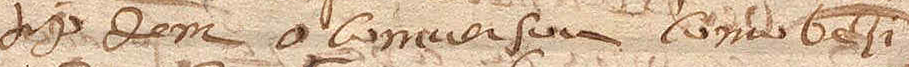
dito tem o comversou como vezi
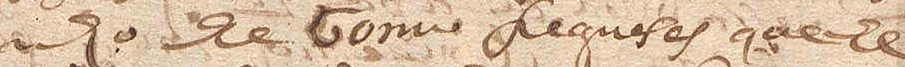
nho he como fregueses que he
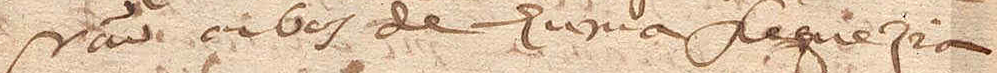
rão anbos de huma freguezia
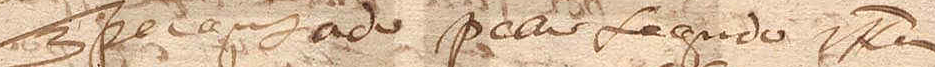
item pergutado pello segudo it̄tem
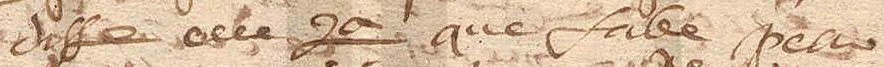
disse elle ta que sabe pello
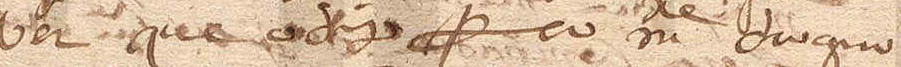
ver que o dito Reo mtre dioguo
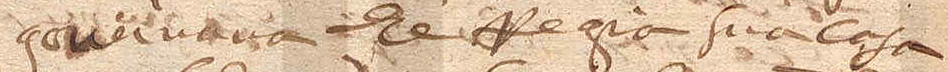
gouernaua he Regia sua casa
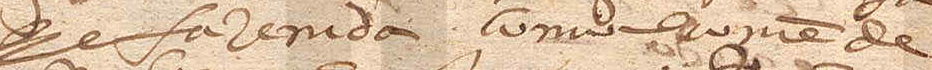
he fazemda como homē de
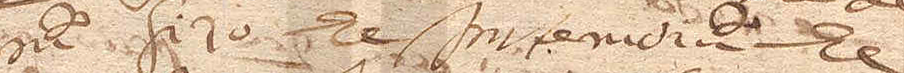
mto sizo he Jmtemdimto he
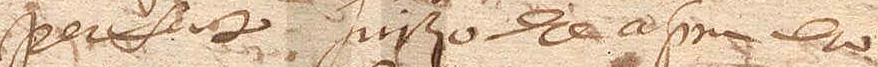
perfeito Juizo he asim ho
